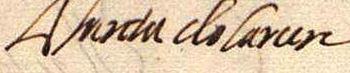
Planta do Carcere
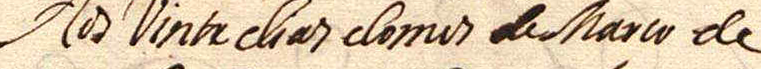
Aos Vinte dias do mes de Março de
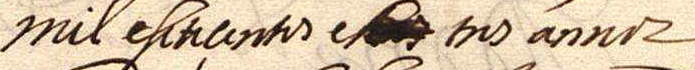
mil e seteçentos e ___ tres annoz
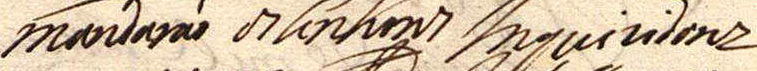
mandaraõ os senhores Jnquizidores
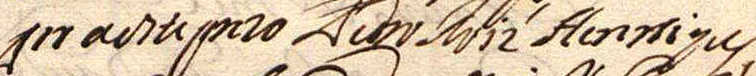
por a este prezo Pedro Roiz̄ Henrriques,
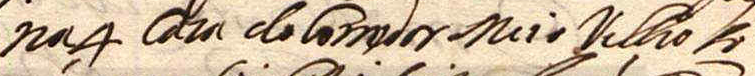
na 4 Caza do Corredor Meio Velho só
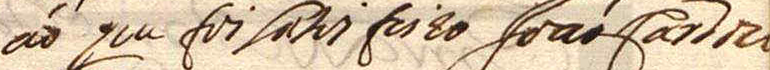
ao que foi satisfeito Joaõ Cardozo
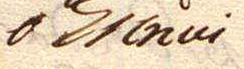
o Escreui
